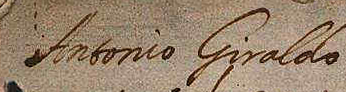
Antonio Giraldo
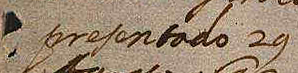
presentado 29
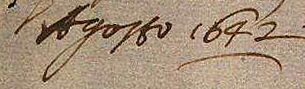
Agosto 1642
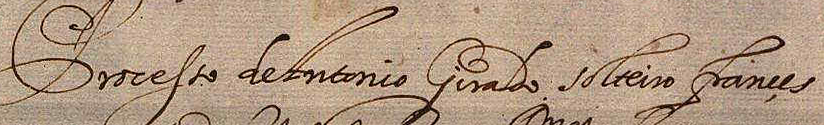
Processo de Antonio Giraldo solteiro frances
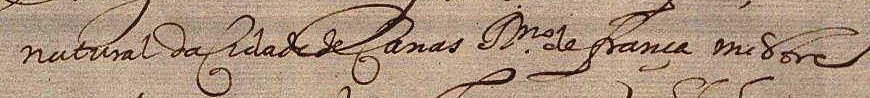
natural da Cidade de Canas R.no de frança mestre
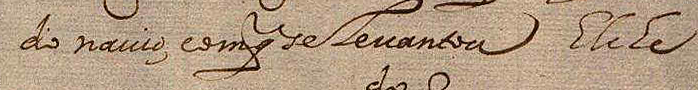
do nauio, com q̄ se Leuantou Ele he
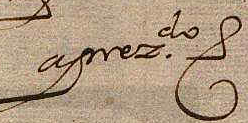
aprez.do
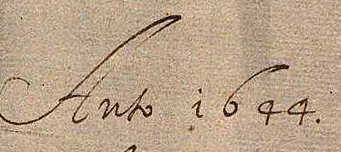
Auto i644.
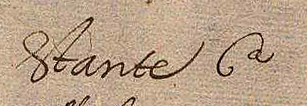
estante 6a
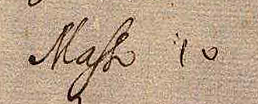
Masso 10
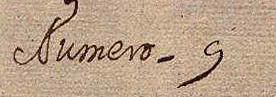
Numero - 9
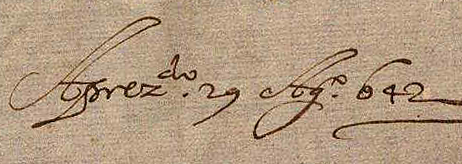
Aprez.do 29 Ag.o 642
